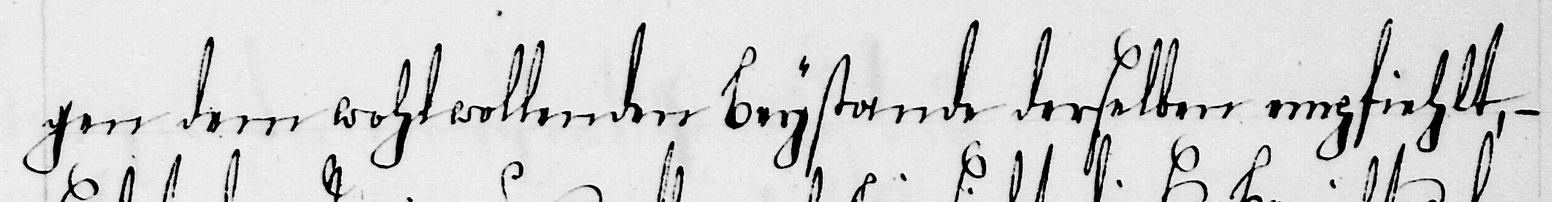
gen dem wohlwollenden Beystande derselben empfiehlt,
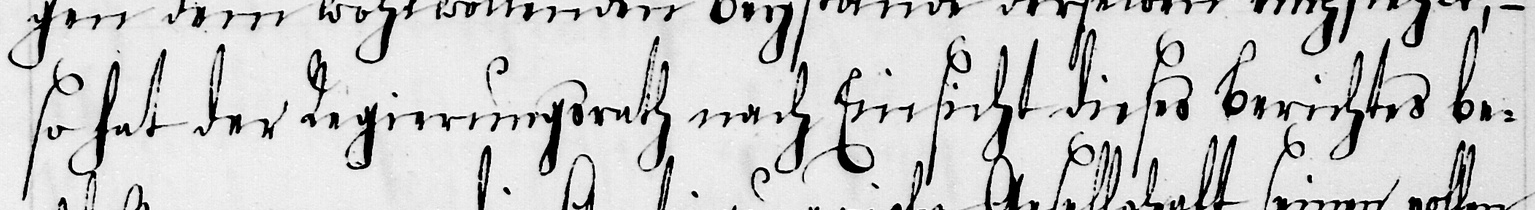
so hat der Regierungsrath nach Einsicht dieses Berichtes be¬
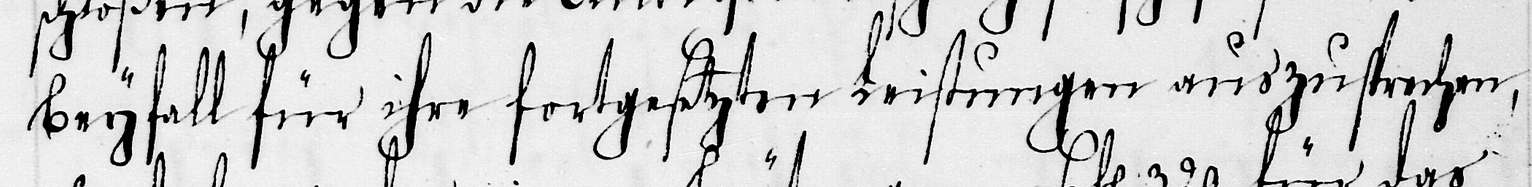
Beyfall für ihre fortgesetzten Leistungen auszusprechen,
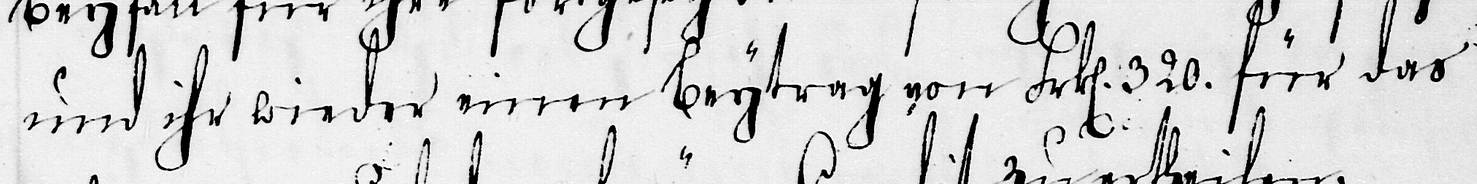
und ihr wieder einen Beytrag von Frk[en] 320. für das
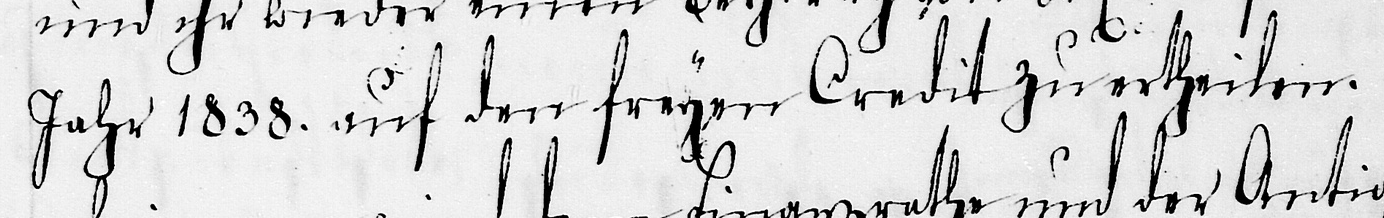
Jahr 1838. auf den freyen Credit zu ertheilen.
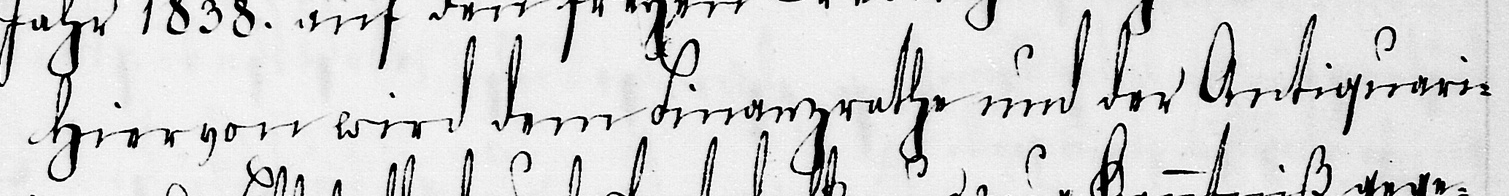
Hiervon wird dem Finanzrathe und der Antiquari¬
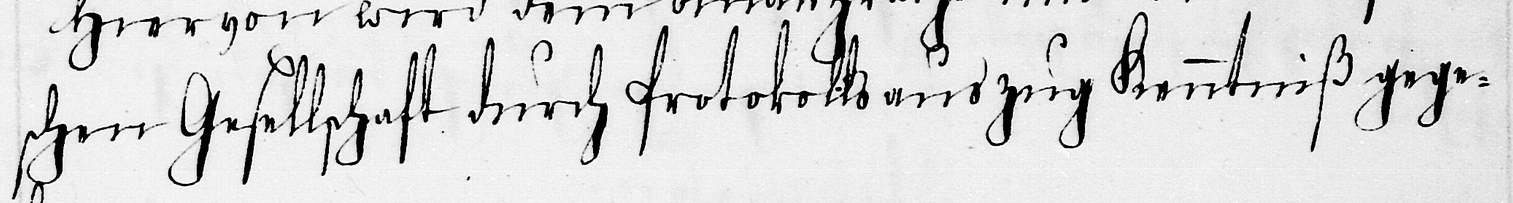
schen Gesellschaft durch Protokollsauszug Kenntniß gege¬
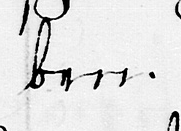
ben.
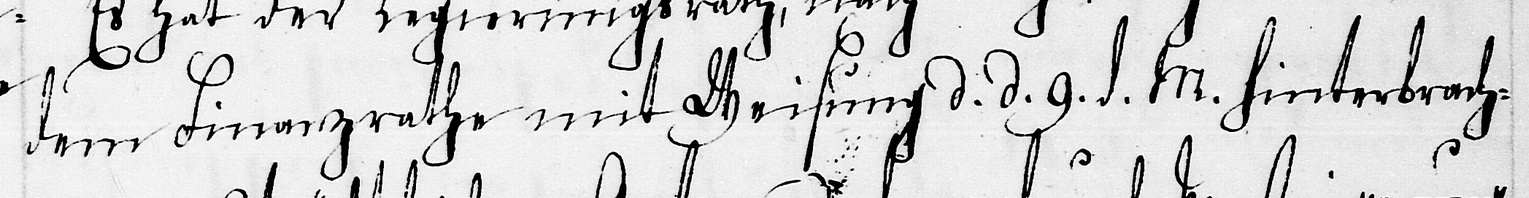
dem Finanzrathe mit Weisung d. d. 9. d. M. hinterbrach¬
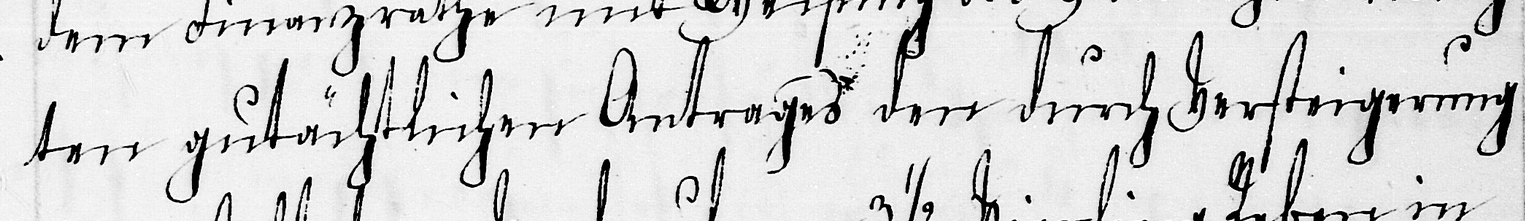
ten gutächtlichen Antrages den durch Versteigerung
